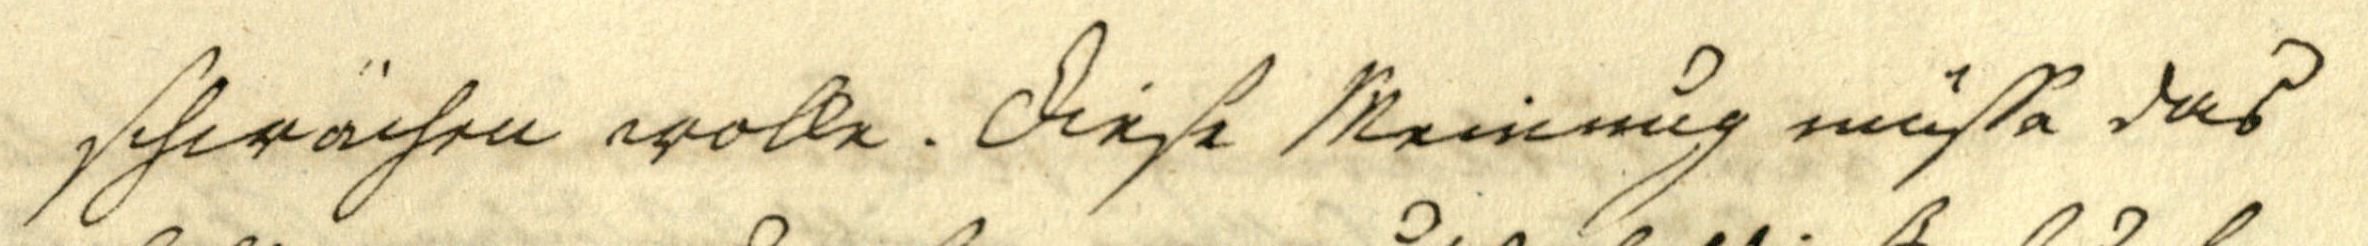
schwächen wolle. Diese Meinung müsse das
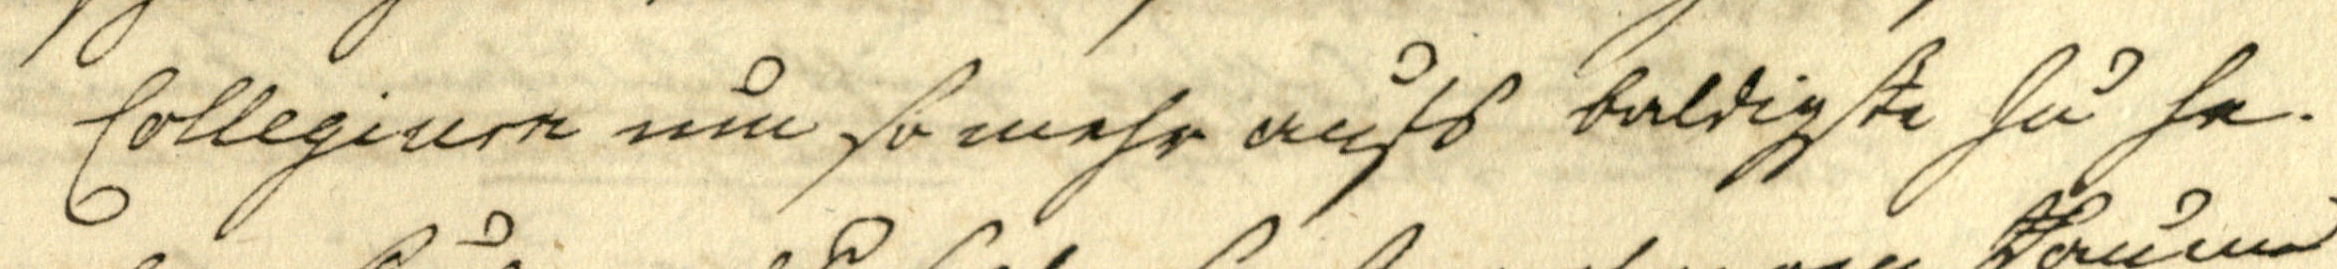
Collegium um so mehr aufs baldigste zu he¬
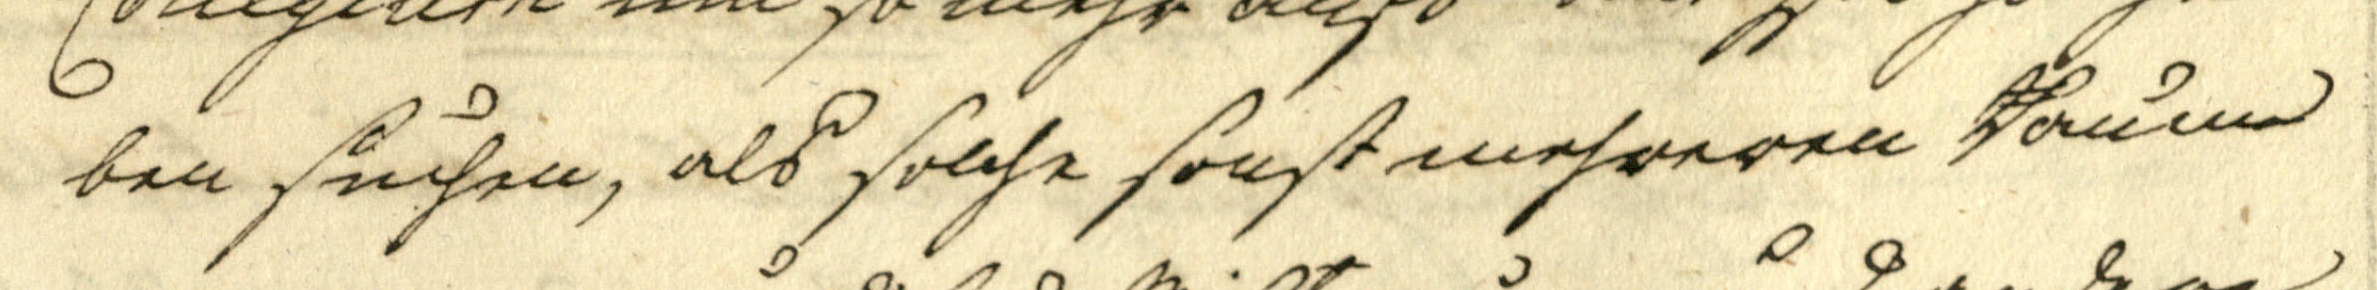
ben suchen, als solche sonst mehreren Raum
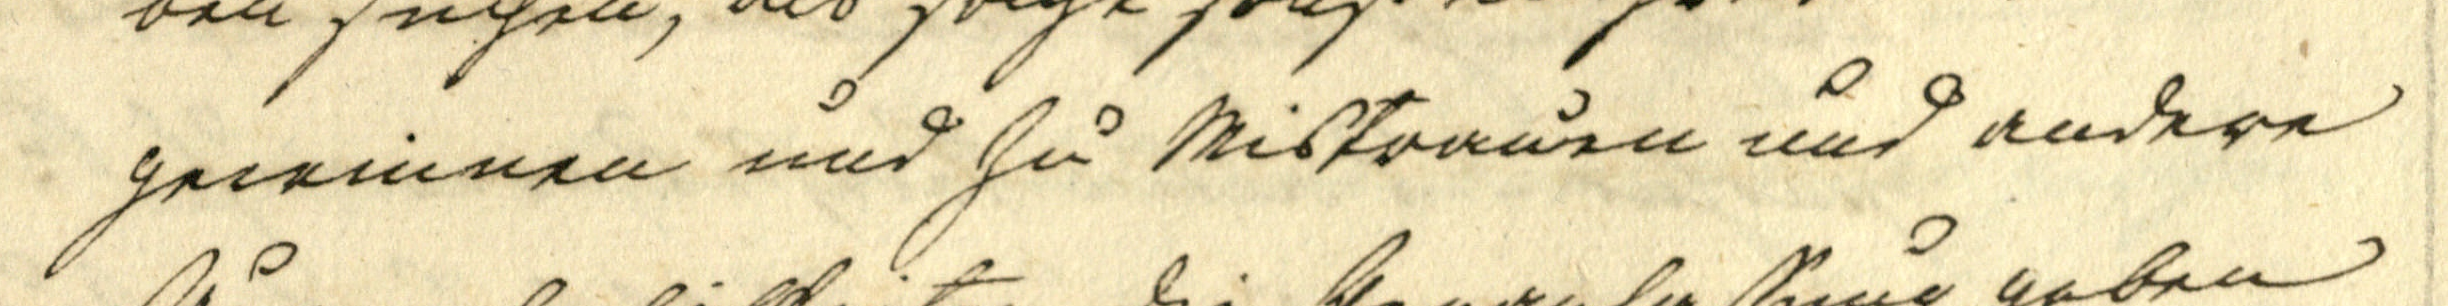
gewinnen und zu Mistrauem und andere
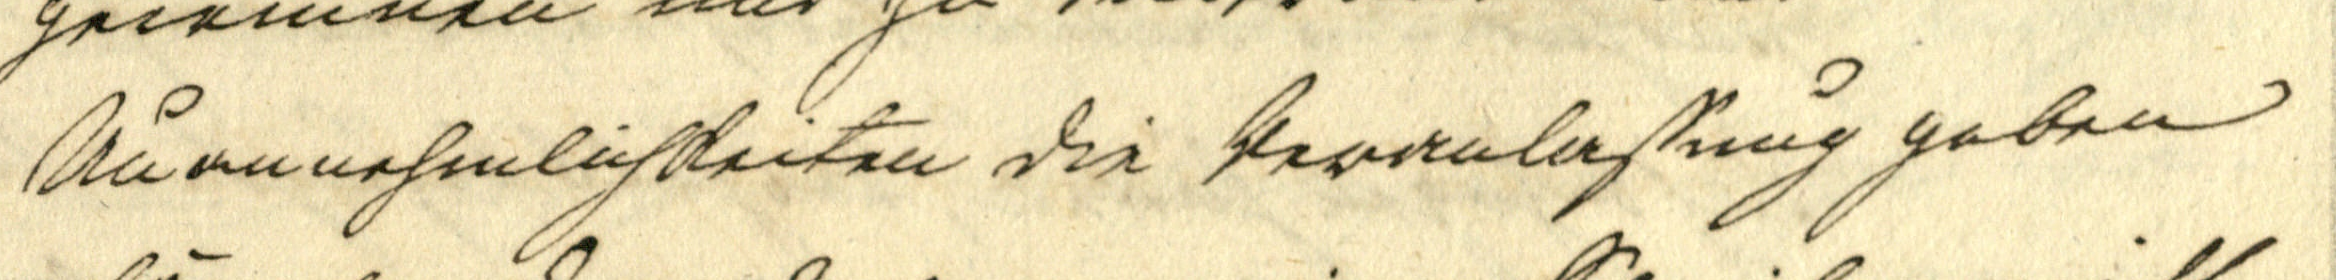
Unannehmlichkeiten die Veranlassung geben
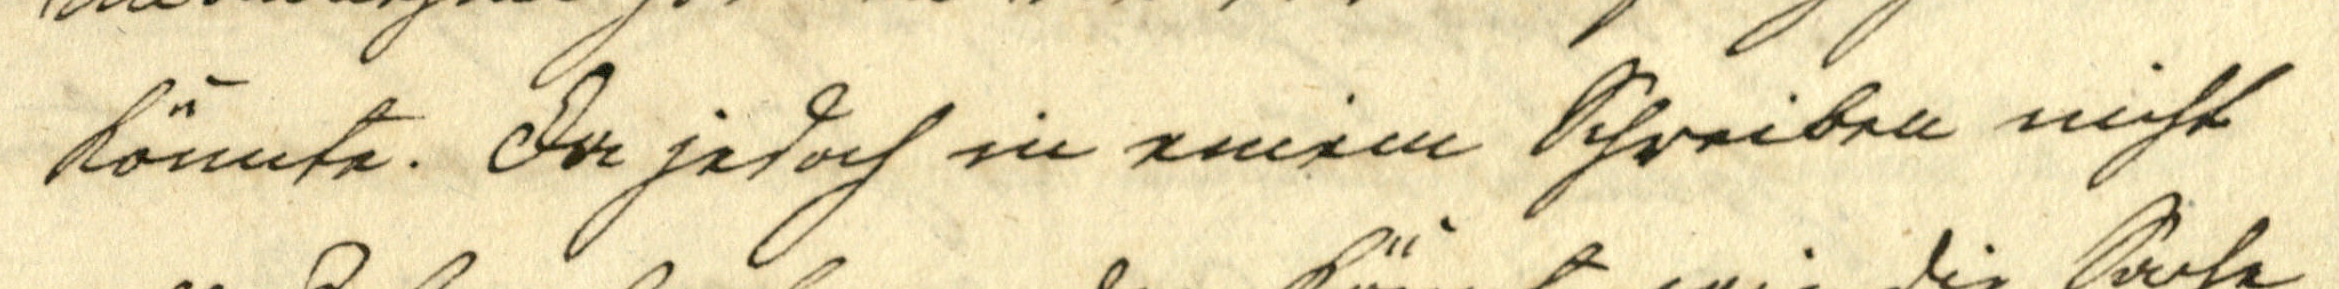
könnte. Da jedoch in einem Schreiben nicht
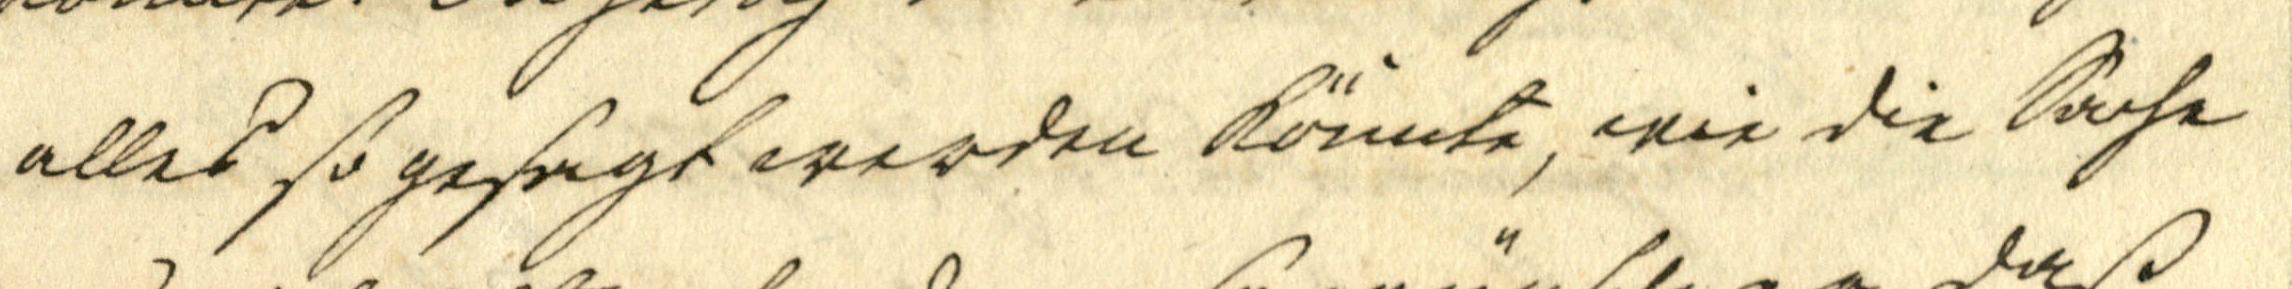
alles so gesagt werden könnte, wie die Sache
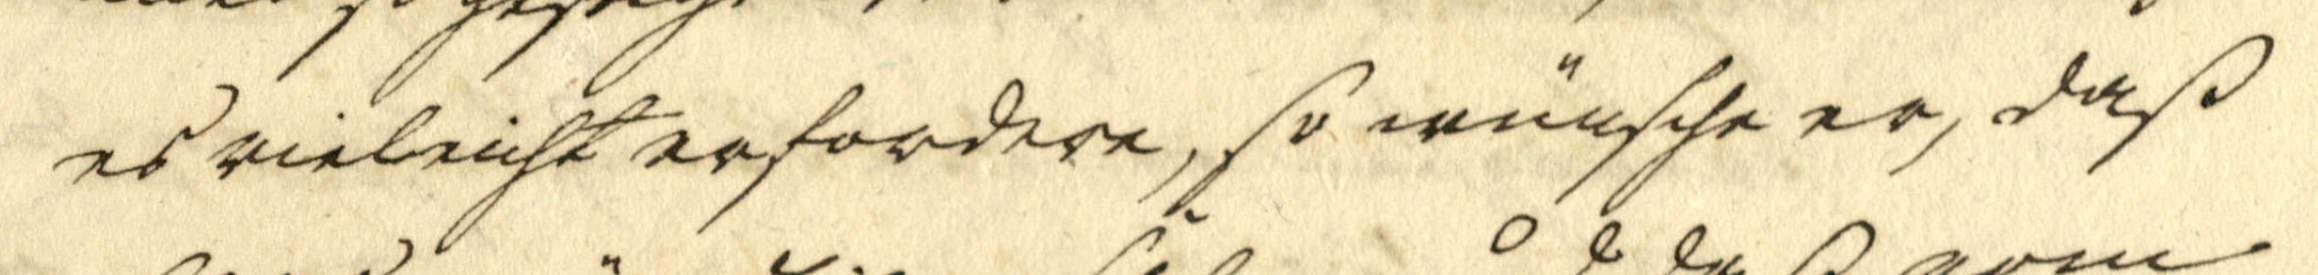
es vieleicht erfordere, so wünsche er, daß
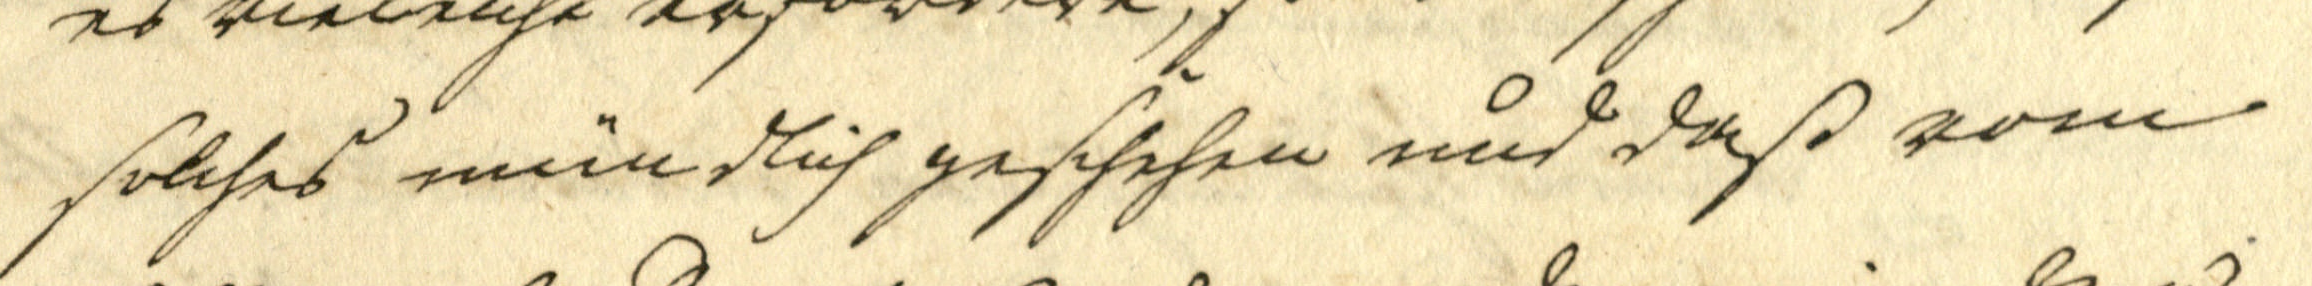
solches mündlich geschehen und daß vom
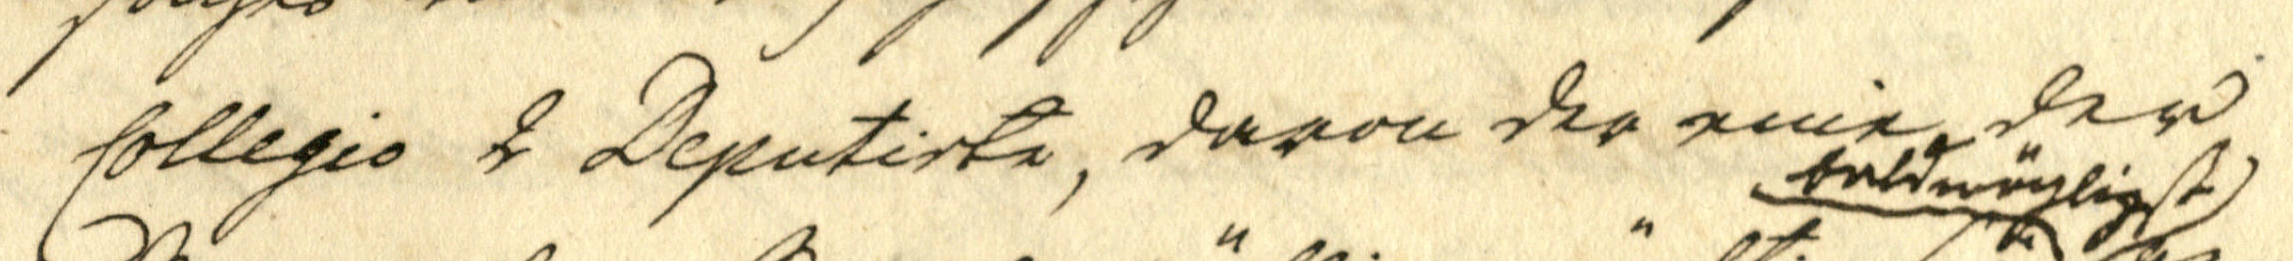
Collegio 2 Deputirte, davon der eine der
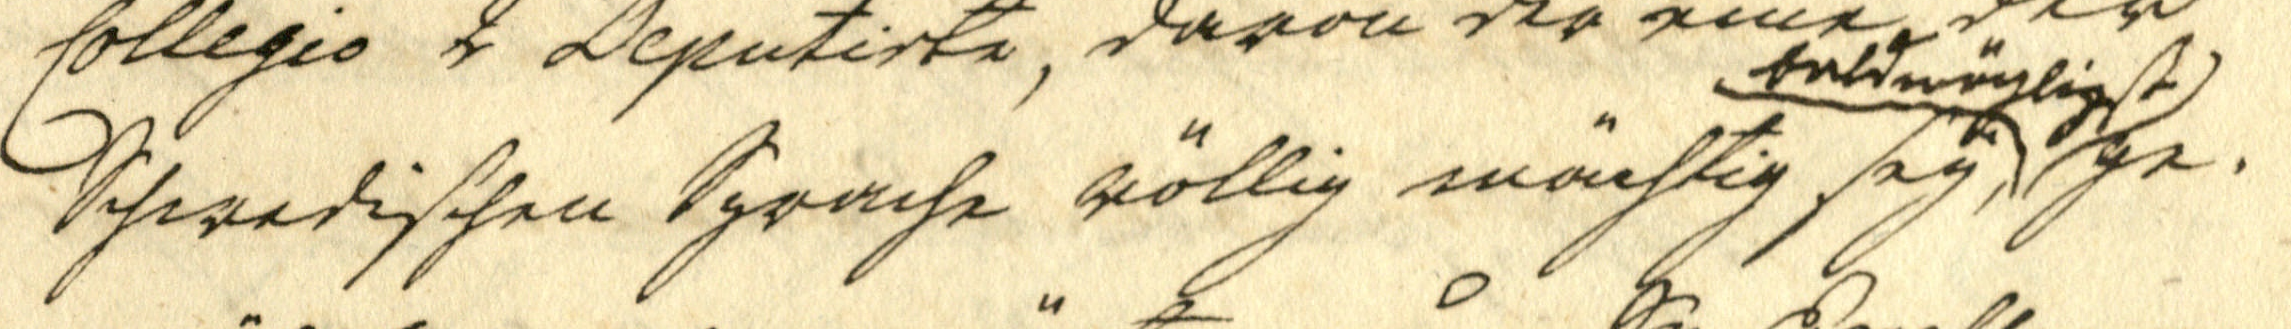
Schwedischen Sprache völlig mächtigseÿ, baldmögligst ge¬
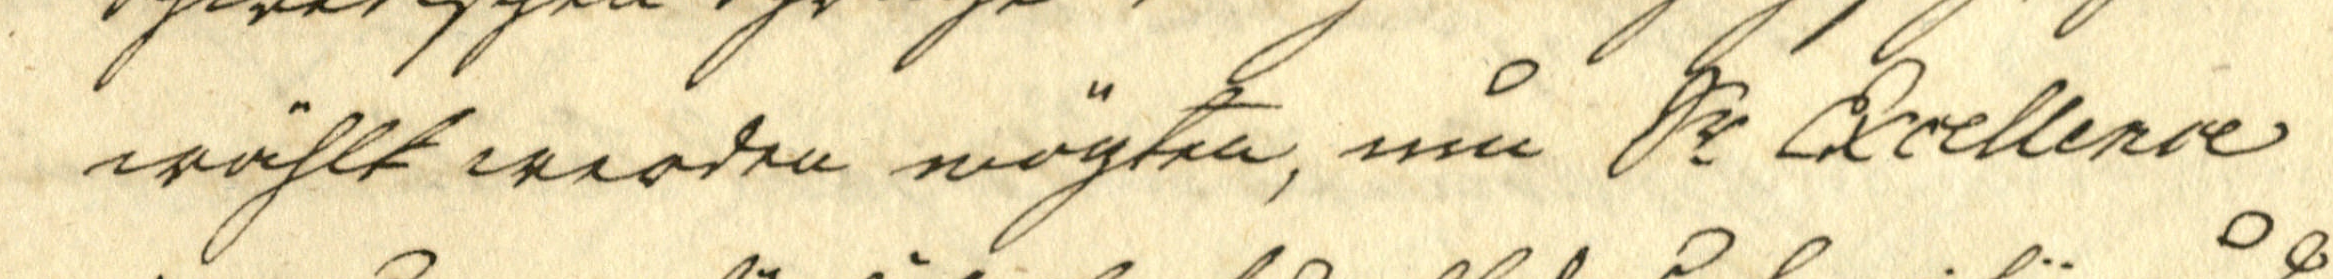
wählt werden mögten, um Sr Excellence
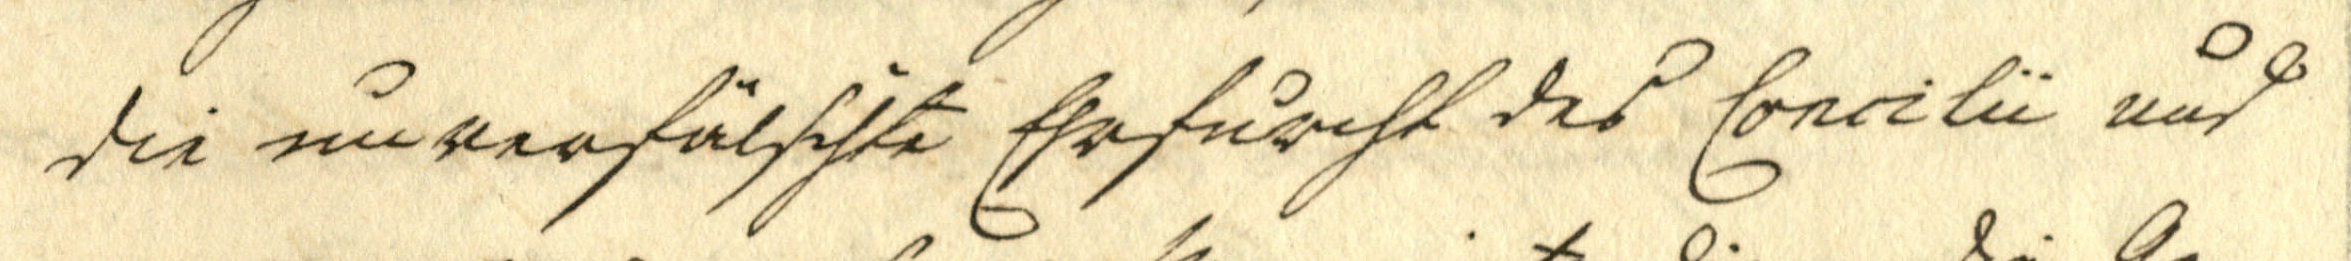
die unverfälschte Ehrfurcht des Concilii und
